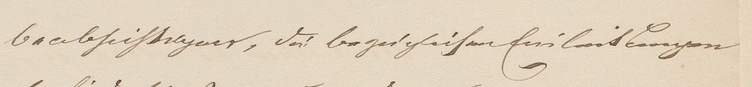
beabsichtigen, die bezüglichen Einleitungen
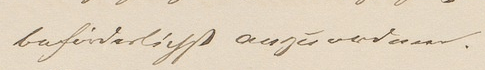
beförderlichst anzuordnen.
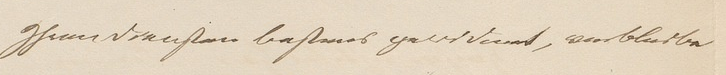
Ihren Diensten bestens gewidmet, verbleibe
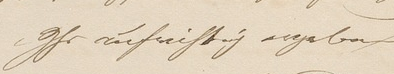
Ihr aufrichtig ergebener
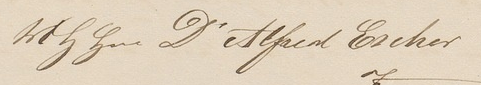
Tit HHrn Dr Alfred Escher
